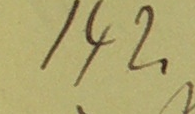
142
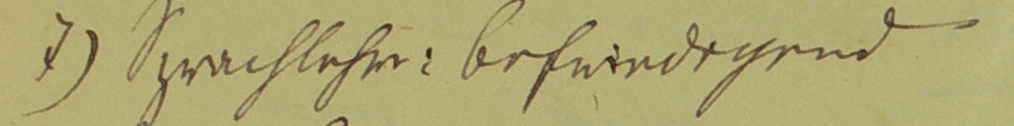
7. Sprachlehre Befriedigend
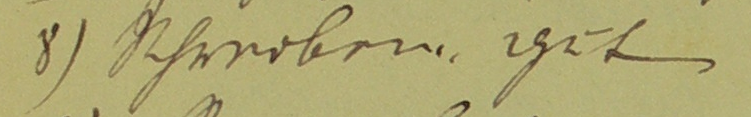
8. Schreiben gut
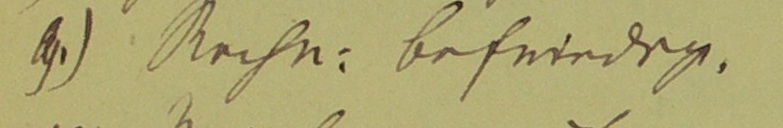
9. Rechnen gut
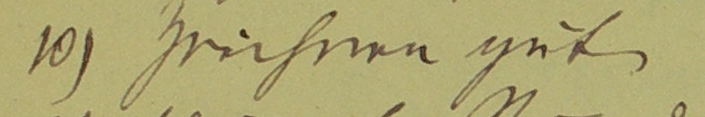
10. Zeichnen gut
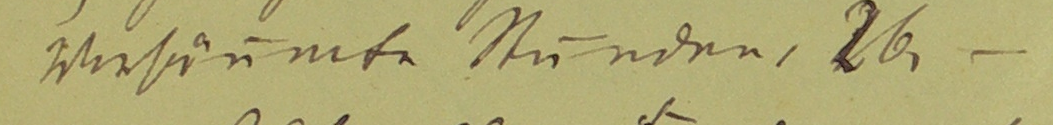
Versäumte Stunden: 26
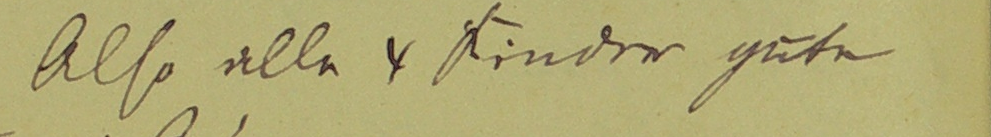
Also alle 4 Kinder gute
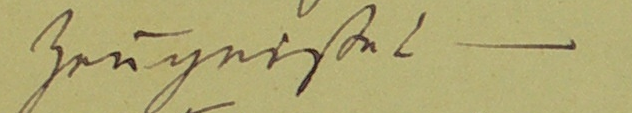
Zeugnisse.
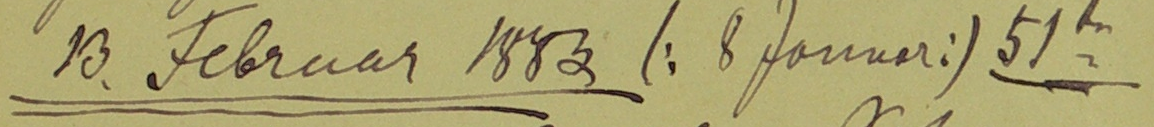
13. Februar 1883 (: 8 Januar :) 51.te
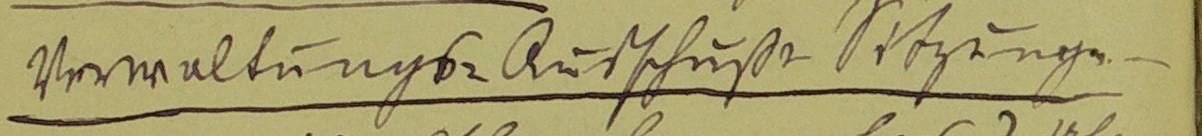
Verwaltungs-Ausschutz-Sitzung.—
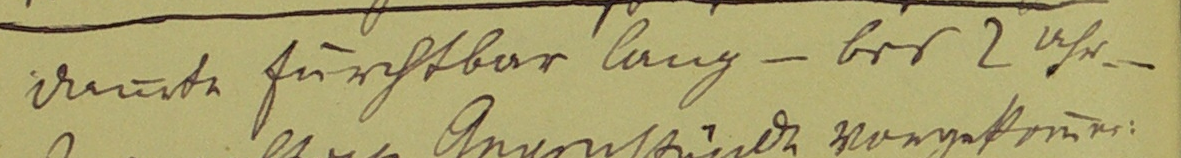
dauerte furchtbar lang- bis 2 Uhr.—
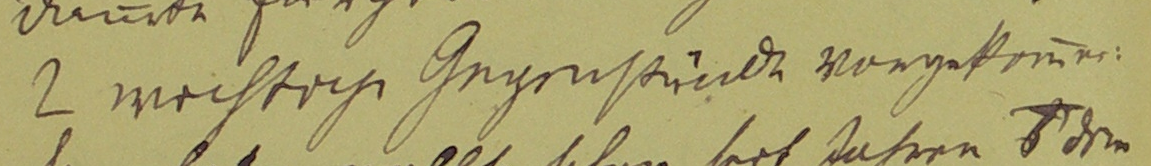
2 wichtige Gegenstände vorgekommen:
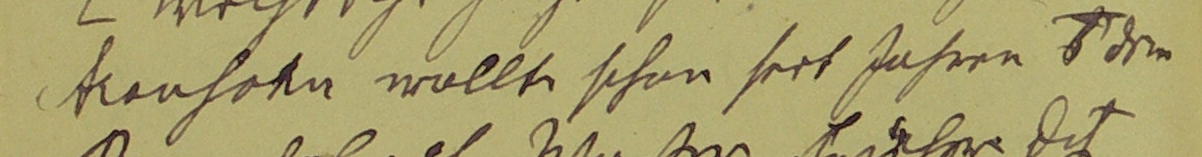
Aransohn wollte schon seit Jahren aus den
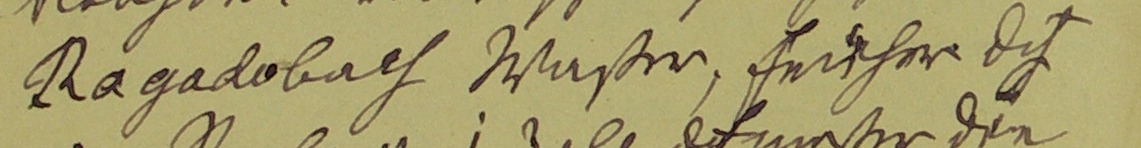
Ragadobach Waßer, ß fließen durch
